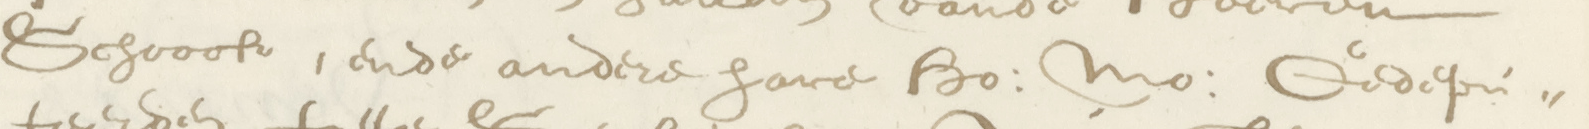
Schoock, ende andere hare Ho:Mo: Gedepu„
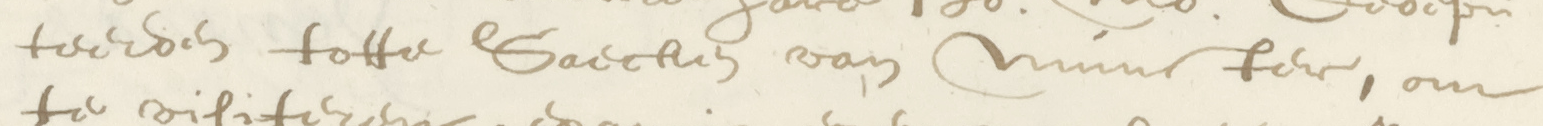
teerden totte saecken van Munster, om
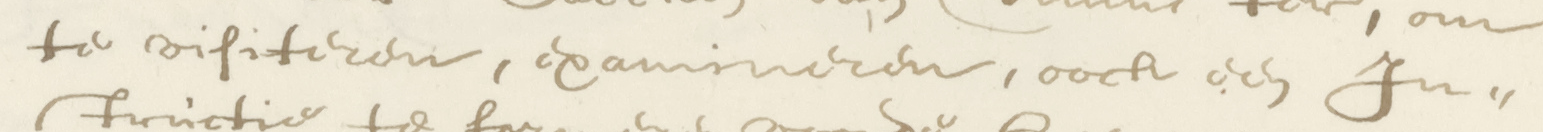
te visiteren, examineren, oock een In,,
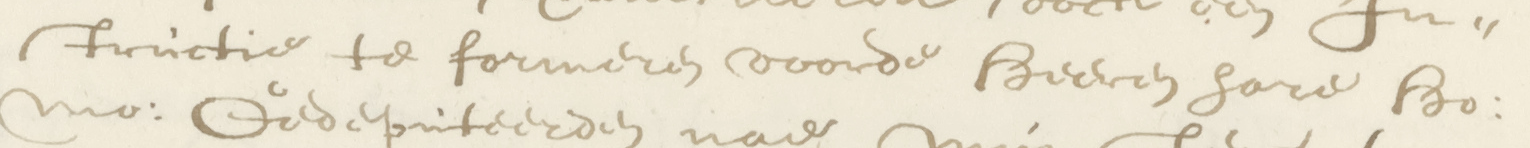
structie te formeren voorde Heeren hare Ho:
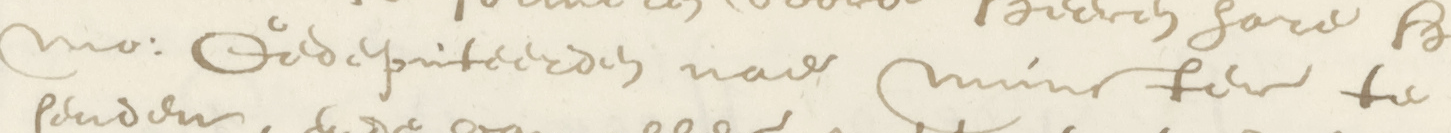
Mo: Gedeputeerden nae Munster te
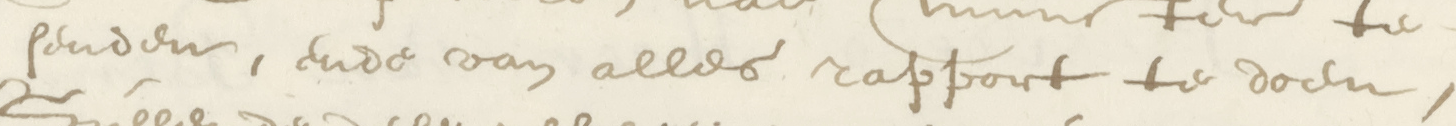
senden, ende van alles rapport te doen.
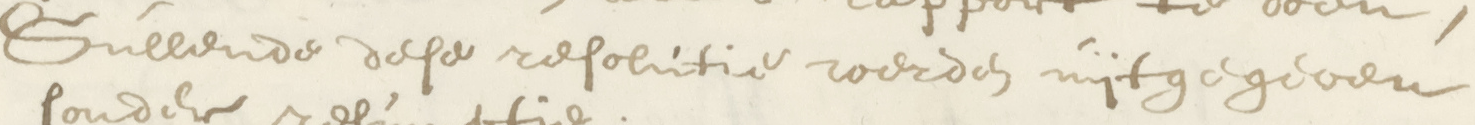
Sullende dese resolutie werden uijtgegeven
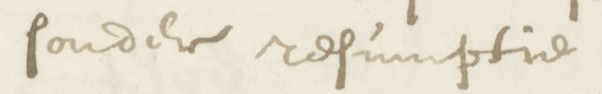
sonder resumptie.
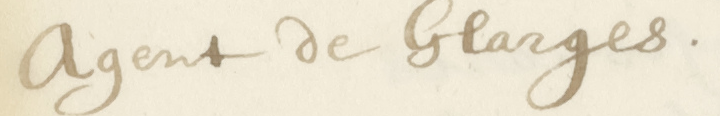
Agent de Glarges.
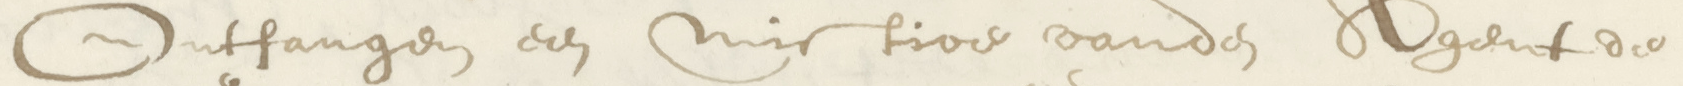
Ontfangen een missive vanden Agent de
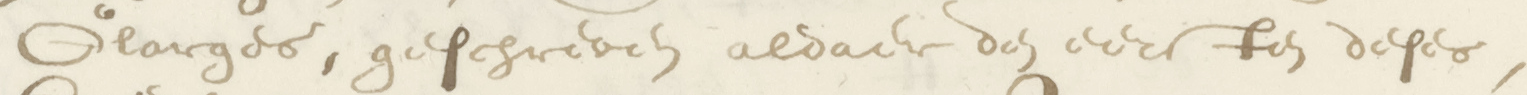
Glarges, geschreven aldaer den eersten deses
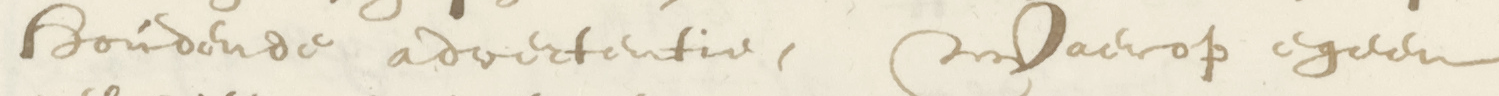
houdende advertentie, waerop egeen
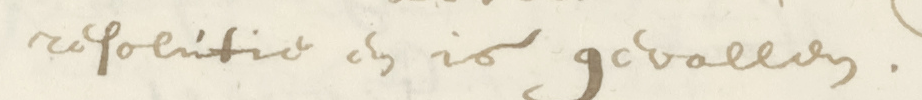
resolutie en is gevallen.
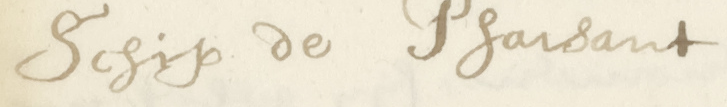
Schip de Phaisant
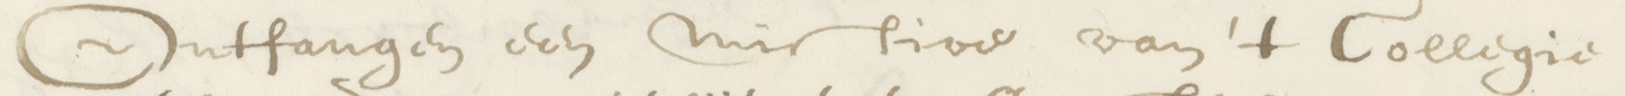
Ontfangen een missive van 't Collegie
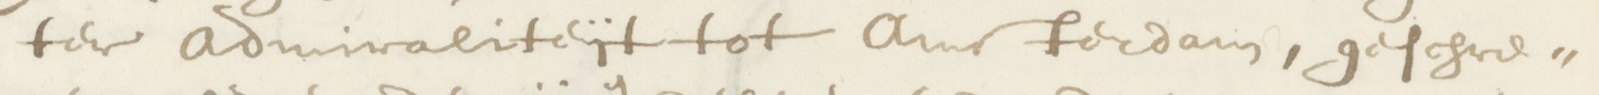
ter Admiraliteijt tot Amsterdam, geschre„
